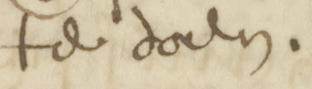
te doen.
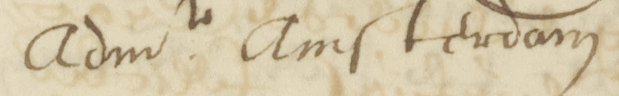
Admt. Amsterdam
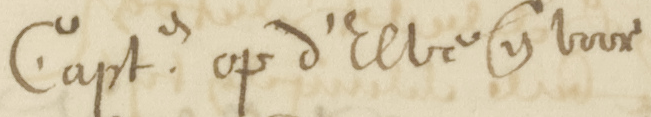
Captn. op d' Elbe en voor
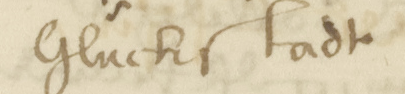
Gluckstadt
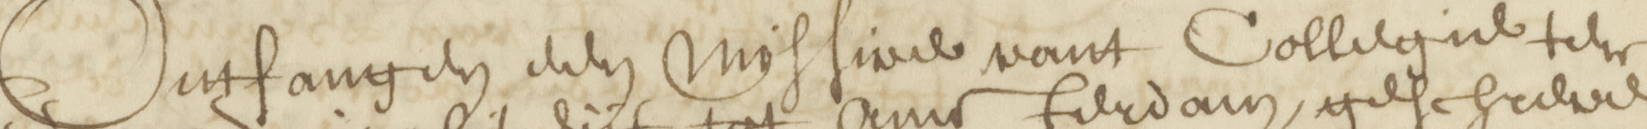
Ontfangen een Missive vant Collegie ter
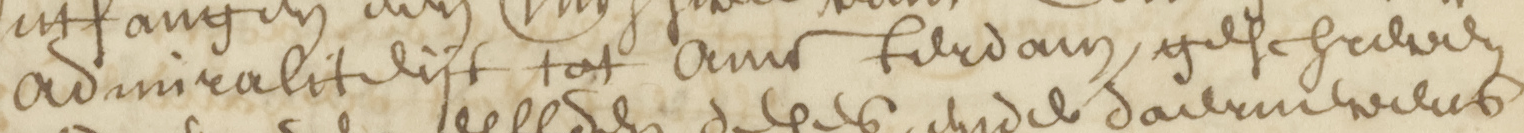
Admiraliteijt tot Amsterdam, geschreven
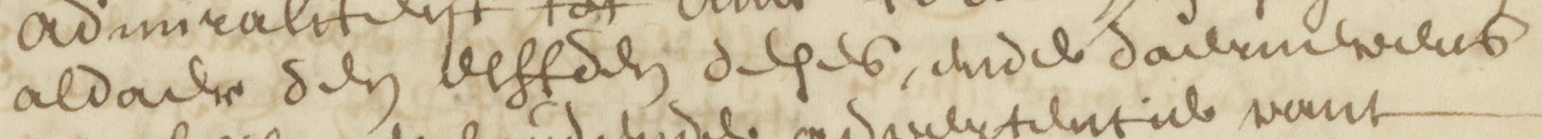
aldaer den elffden deses, ende daernevens
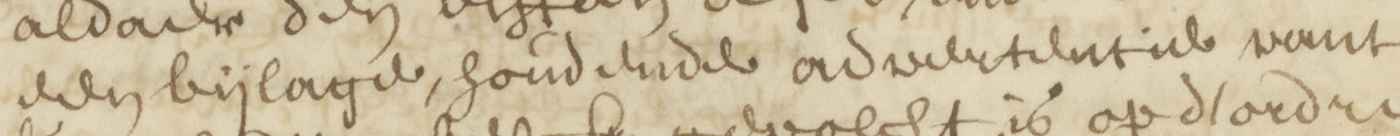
een bijlage, houdende advertentie vant
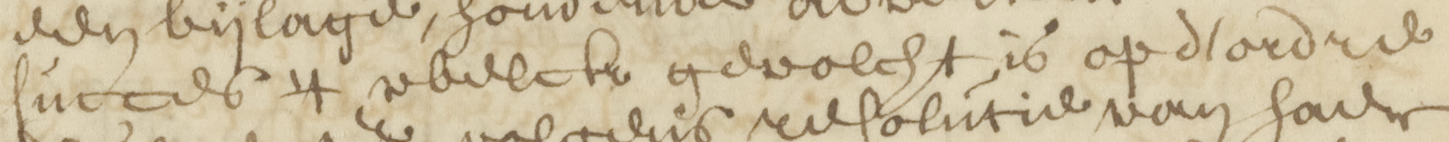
succes ‛t welck gevolcht is op d‛ordre
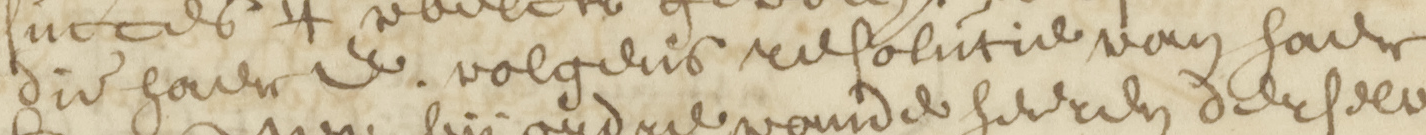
die haer E. volgens resolutie van haer
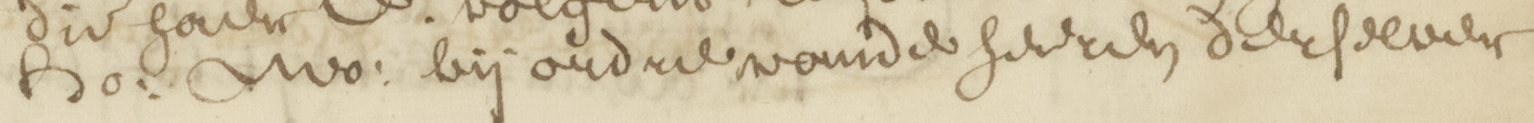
Ho:Mo: bij ordre vande heeren derselver
